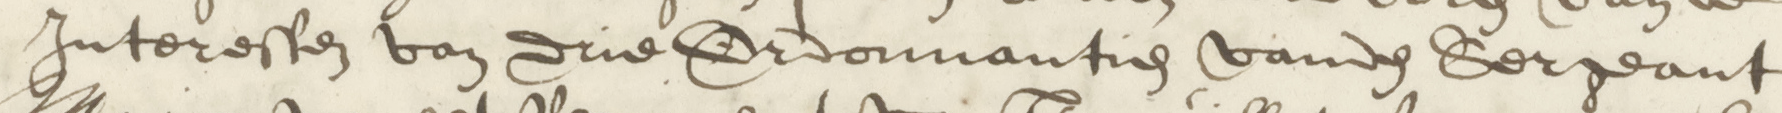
Interessen van Drie Ordonnantien vanden Sergeant
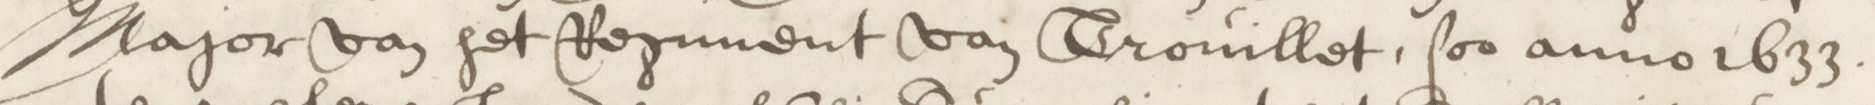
Major van het Regiment van Trouillet, soo anno 1633.
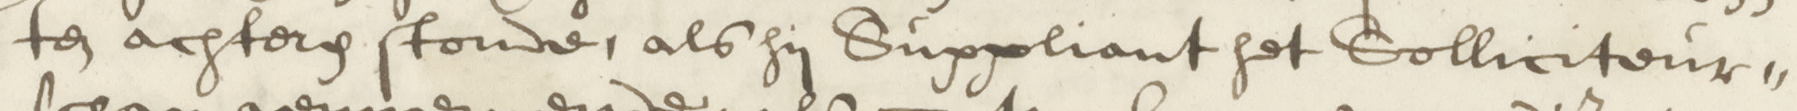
ten achteren stonde, als hij Suppliant het Solliciteur„
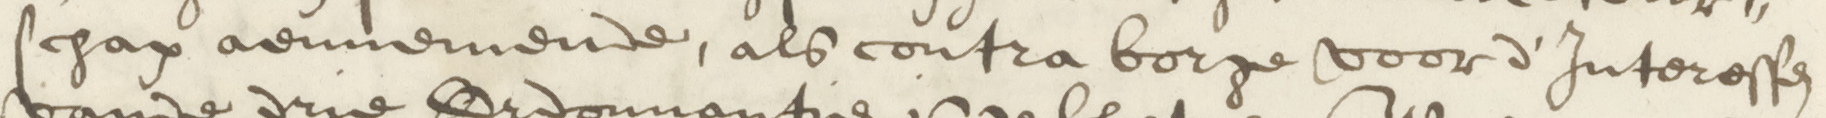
schap aennemende, als contra borge voor d'Interessen
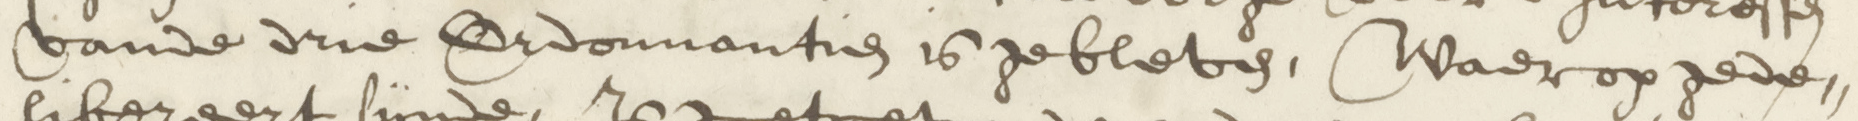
vande drie Ordonnantien is gebleven. Waerop gede„
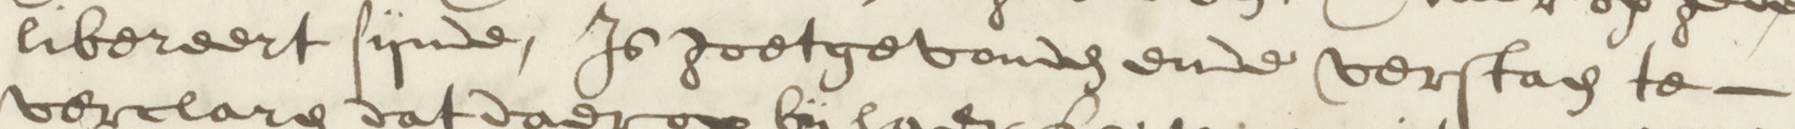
libereert sijnde, Is goetgevonden ende verstaen te —
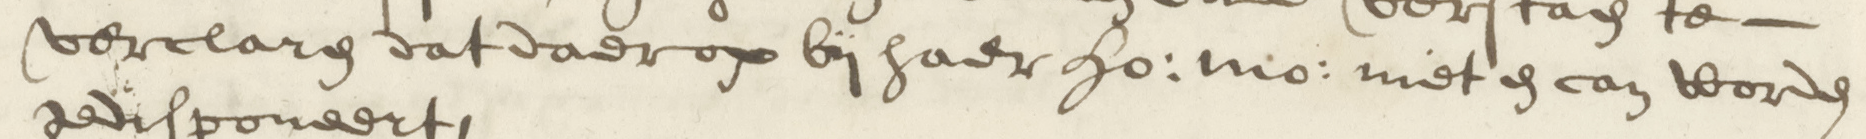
verclaren dat daerop bij haer Ho:Mo: niet en can worden
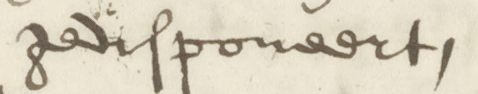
gedisponeert.
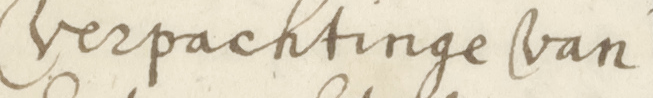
verpachtinge van
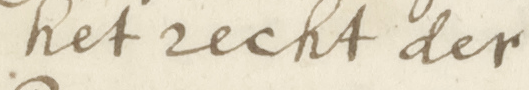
het recht der
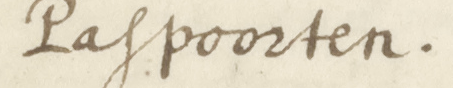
Paspoorten.
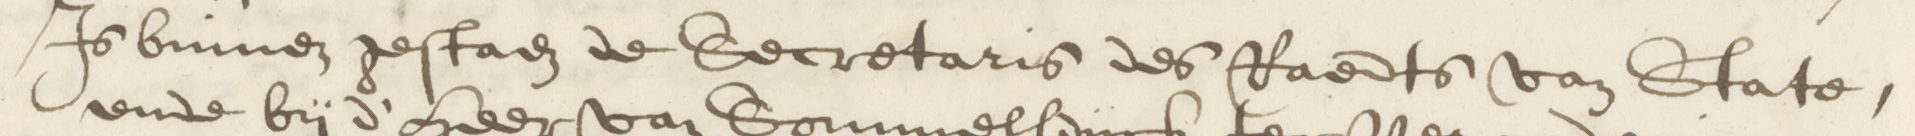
Is binnen gestaen de Secretaris des Raedts van State,
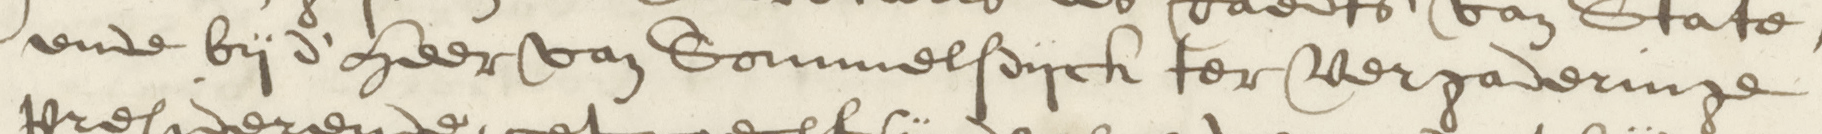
ende bij d'Heer van Sommelsdijck ter Vergaderinge
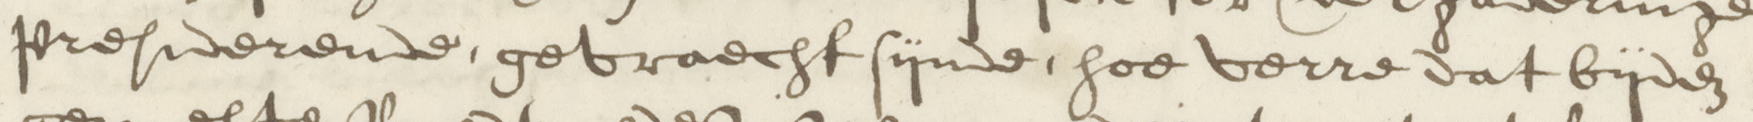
presiderende, gevraecht sijnde, hoe verre dat bijden
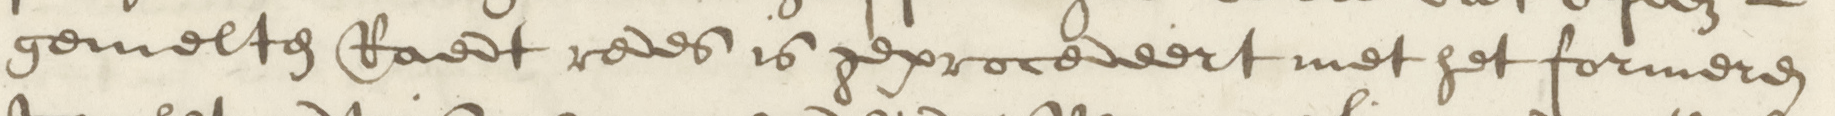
gemelten Raedt redes is geprocedeert met het formeren
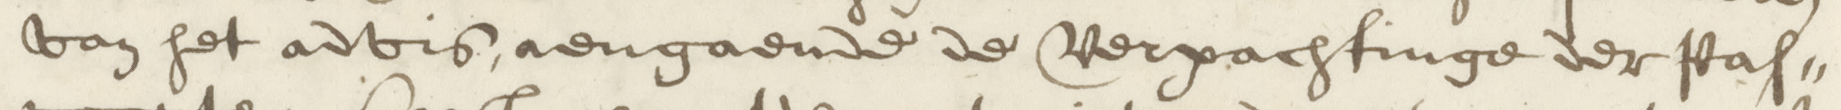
van het advis, aengaende de Verpachtinge der Pas„
